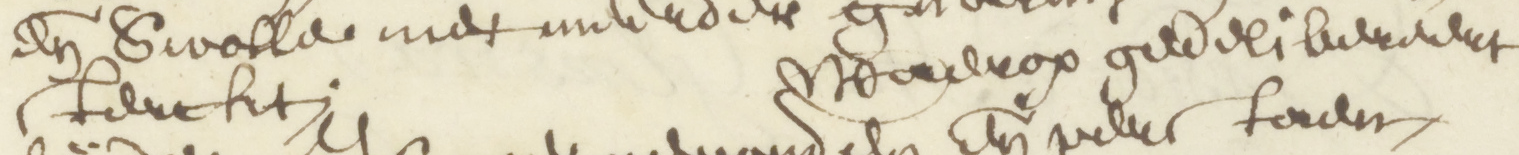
sterckt. Waerop gedelibereert
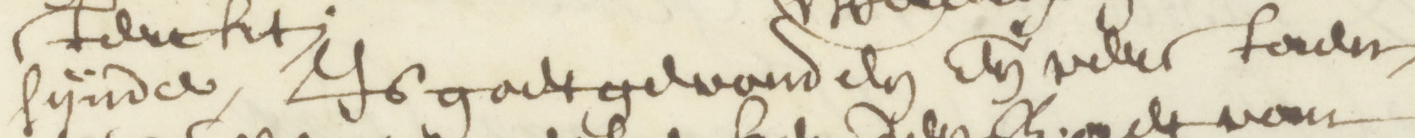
sijnde, Is goetgevonden en verstaen
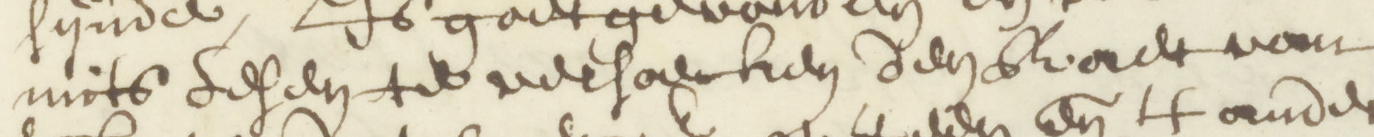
mits desen te versoecken den Raet van
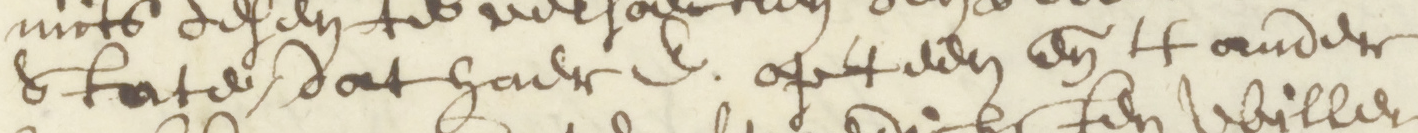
State, dat haer E. opt een en ‛t ander
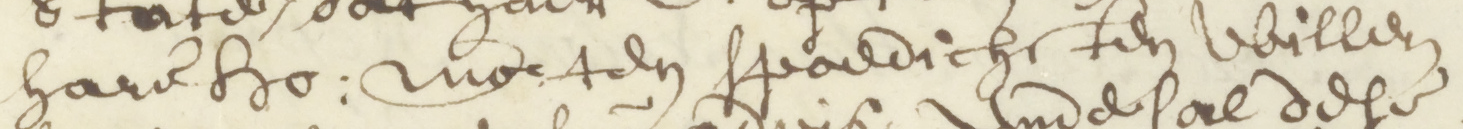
hare Ho:Mo: ten spoedichsten willen
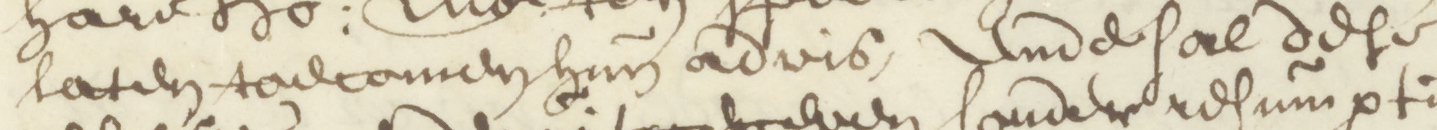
laten toecomen hun advis, Ende sal dese
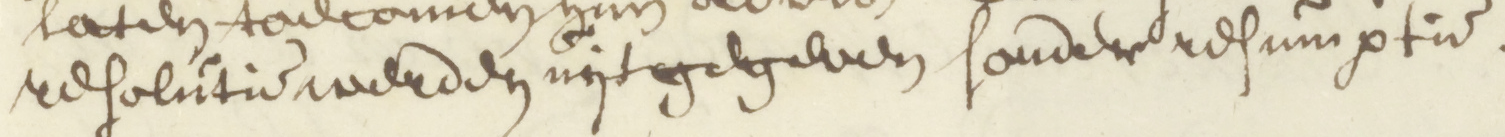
resolutie werden uijtgegeven sonder resumptie.
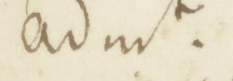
Admt.
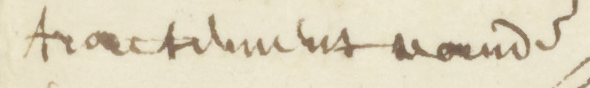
tractement vande
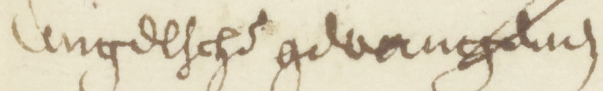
Engelsche gevangenen
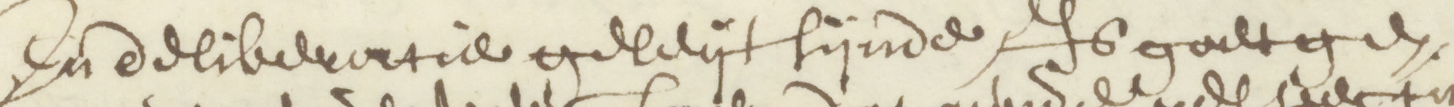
In deliberatie geleijt sijnde, Is goetge„
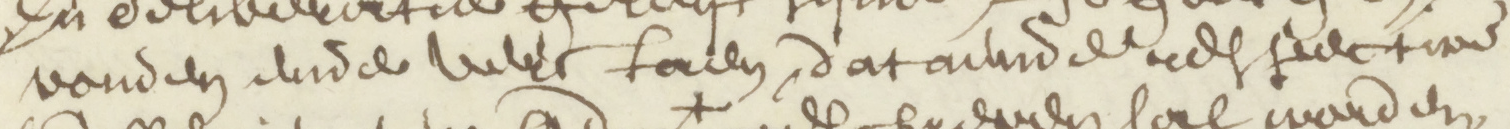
vonden ende verstaen, dat aende respective
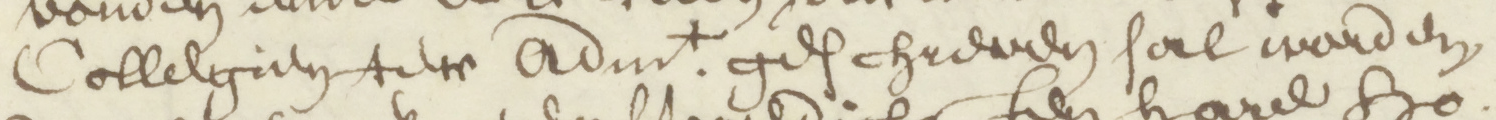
Collegien ter Admt. geschreven sal worden,
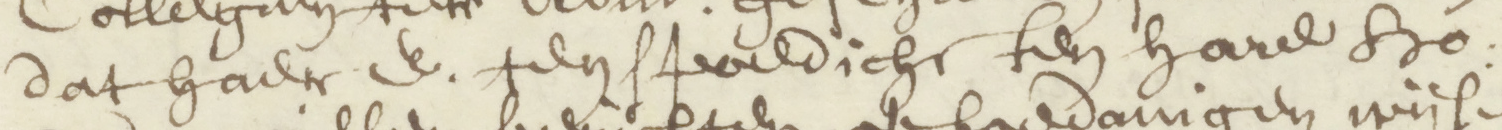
dat haer E. ten spoedichsten hare Ho:
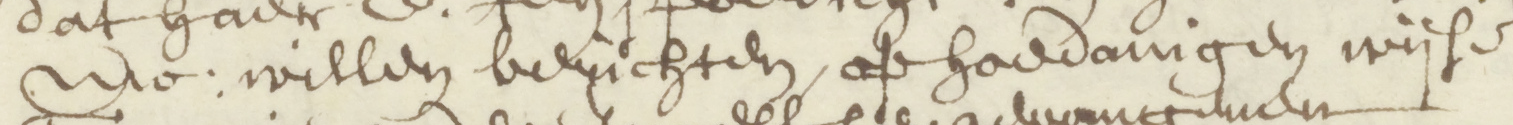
Mo: willen berichten, op hoedanigen wijse
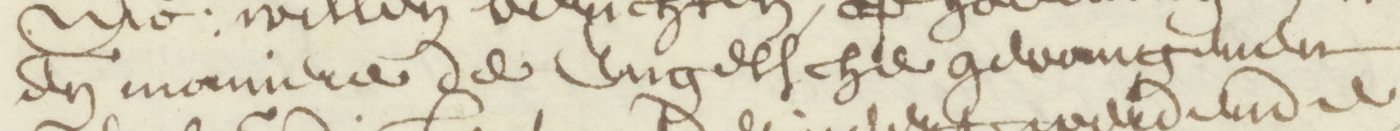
en maniere de Engelsche gevangenen
